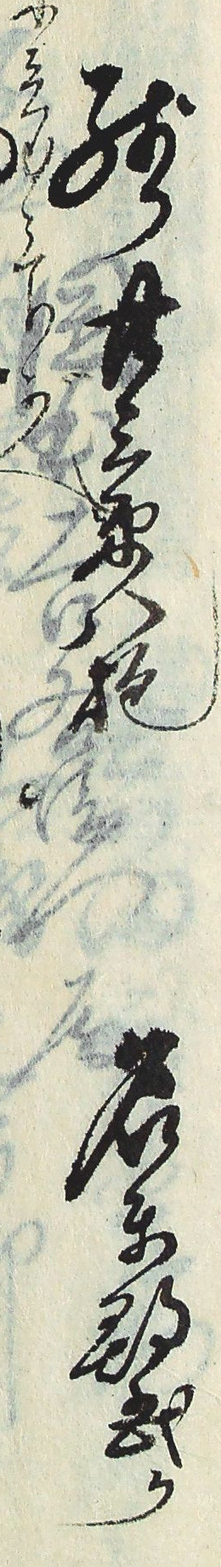残り廿三束八把名東郡当り
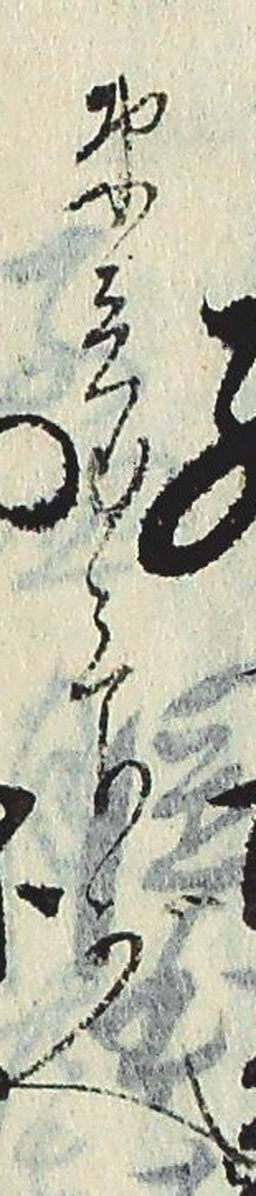束壱匁三分かへ
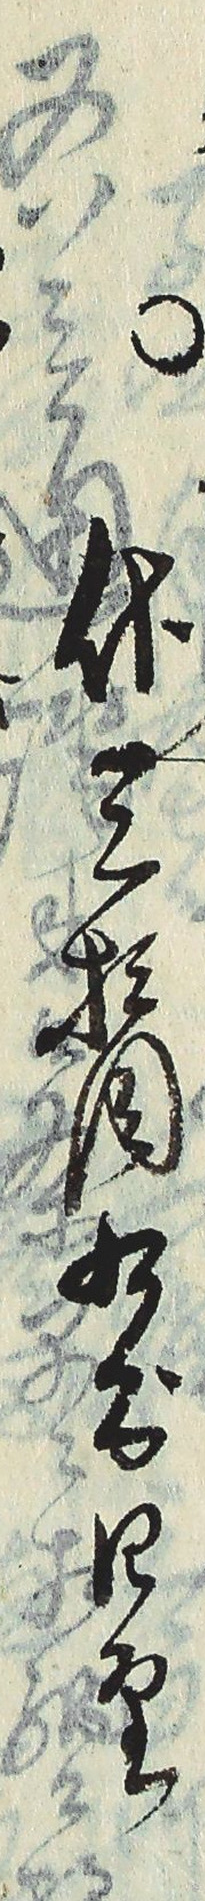代三拾目九分四厘
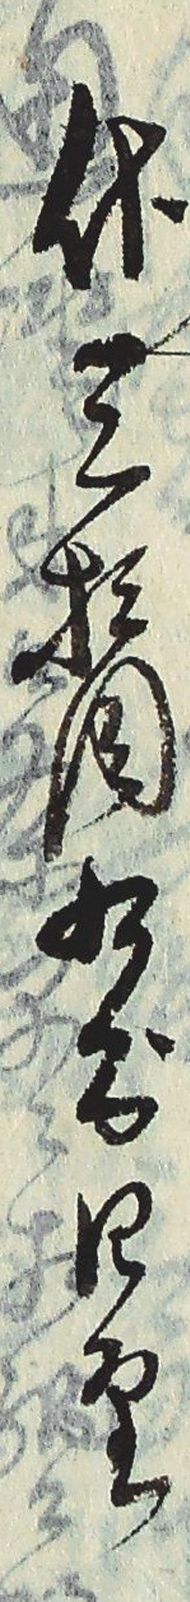代三拾目九分四厘
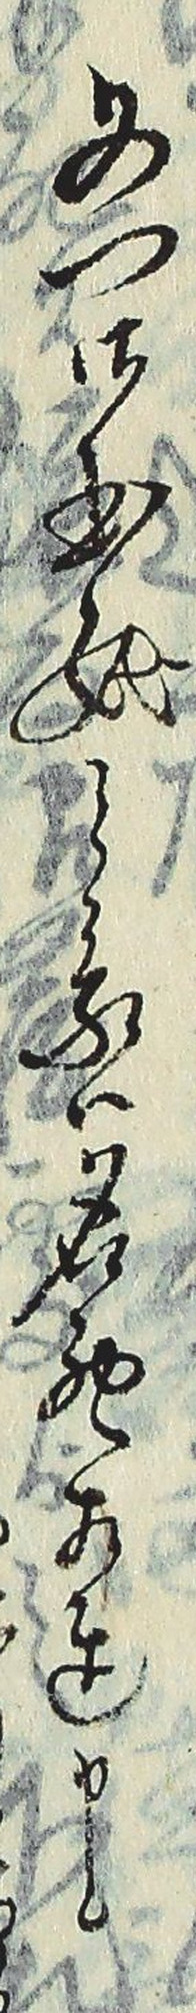右御本紙之義は名西へ相達申候
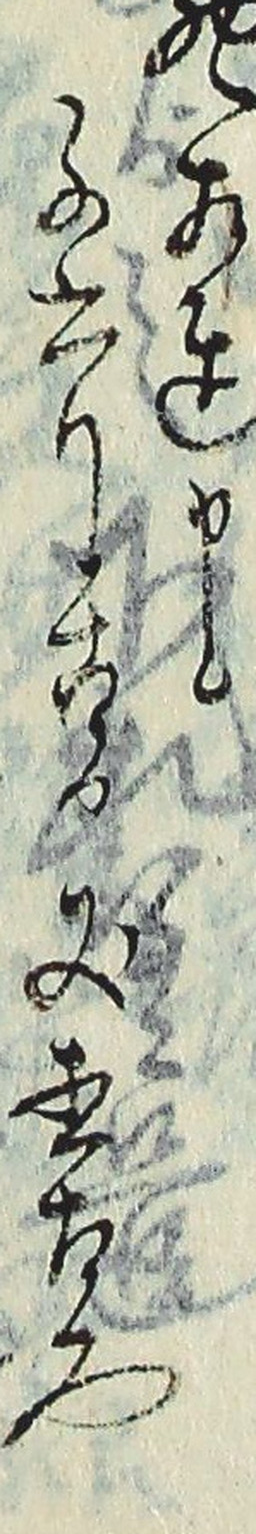子六月十四日使直左衛門
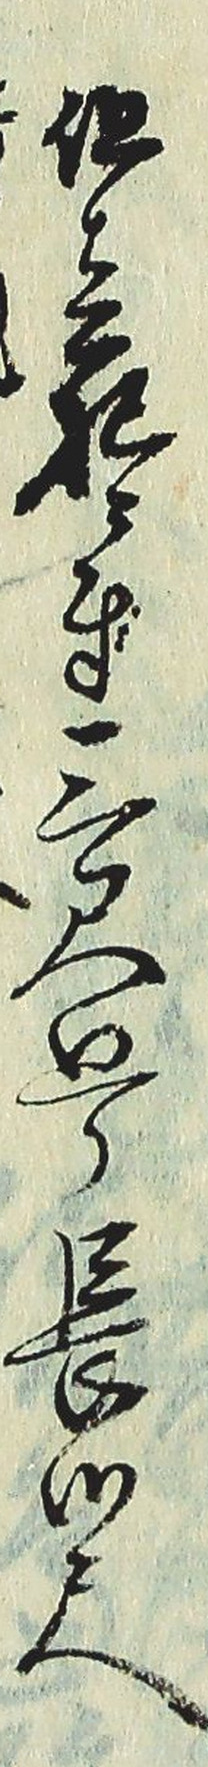但壱把に付三尺廻り長弐尺
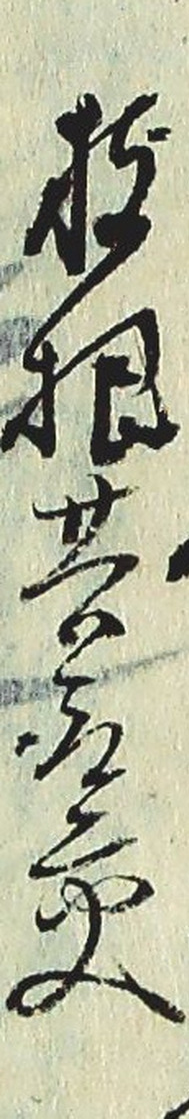枝根共取交
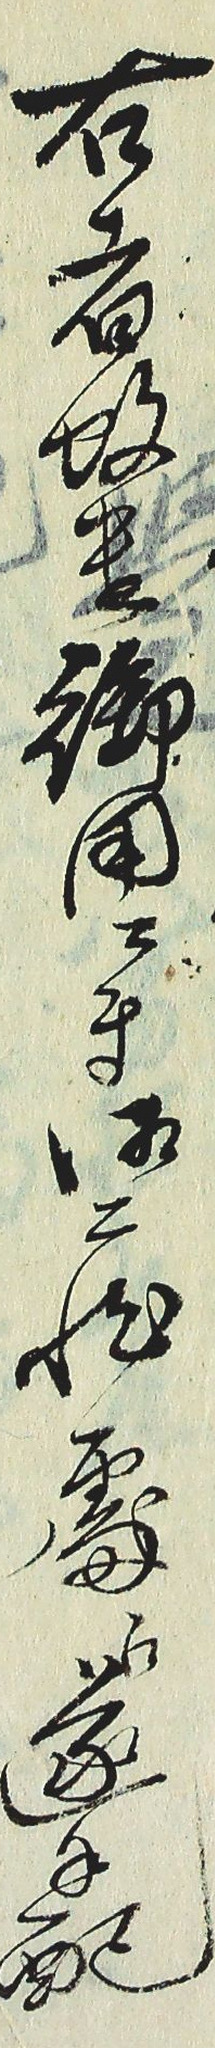右は蚊遣御用に付御蔵処え遂手配
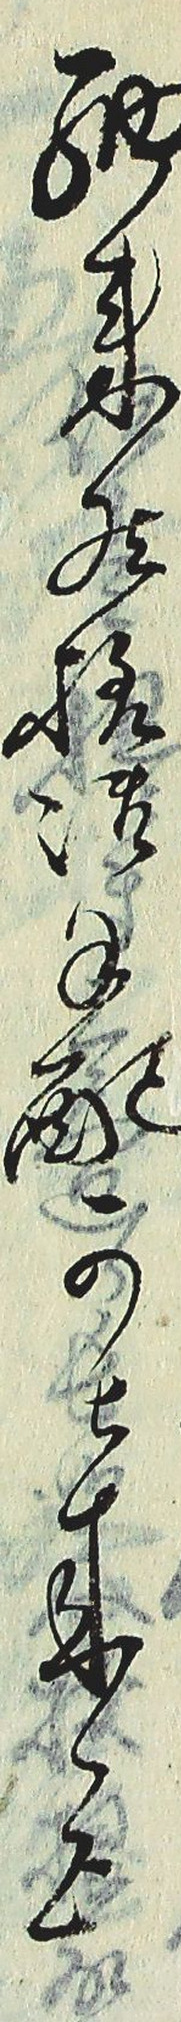納来候様御手配可被成候以上
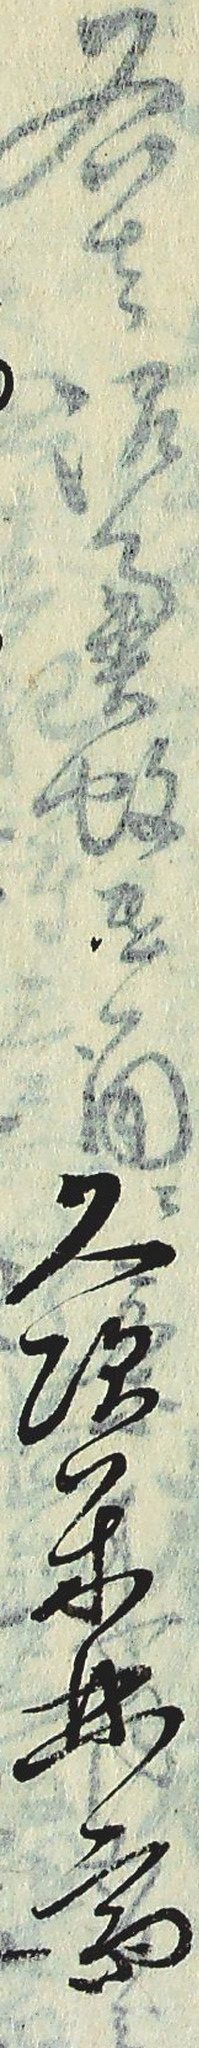久次米林斎
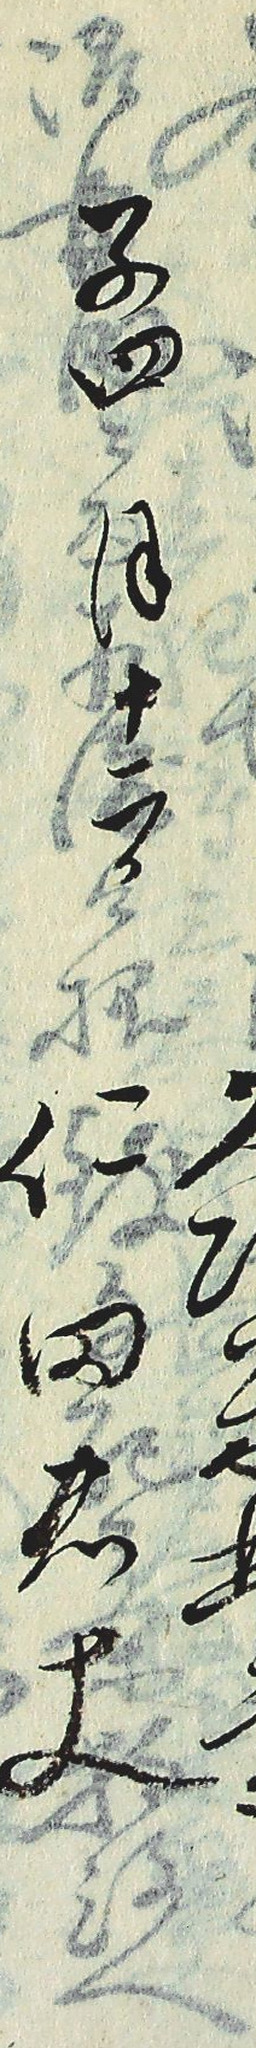子四月十二日仁田忠丈
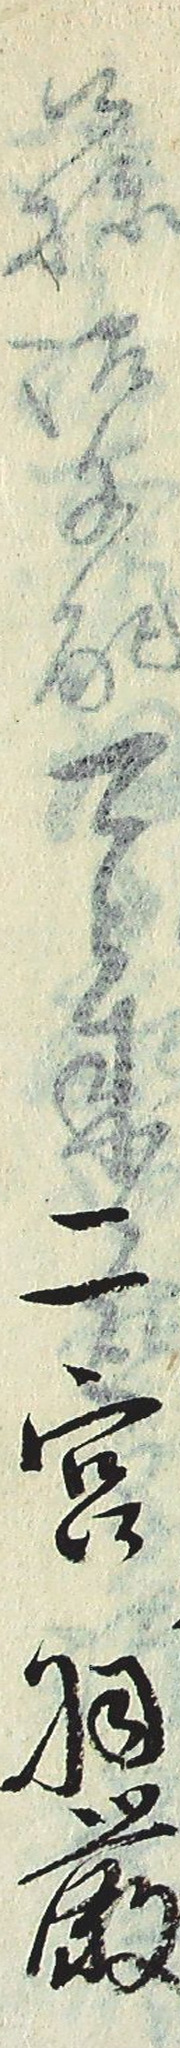二宮羽厳
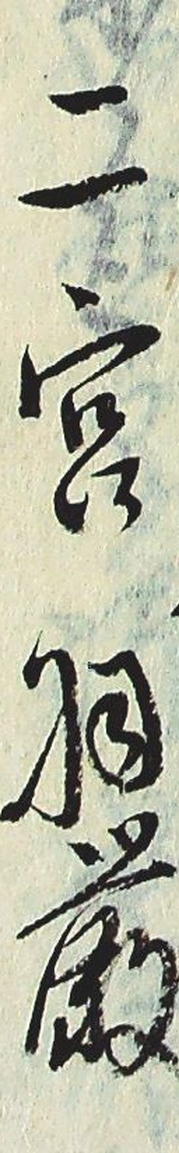二宮羽厳

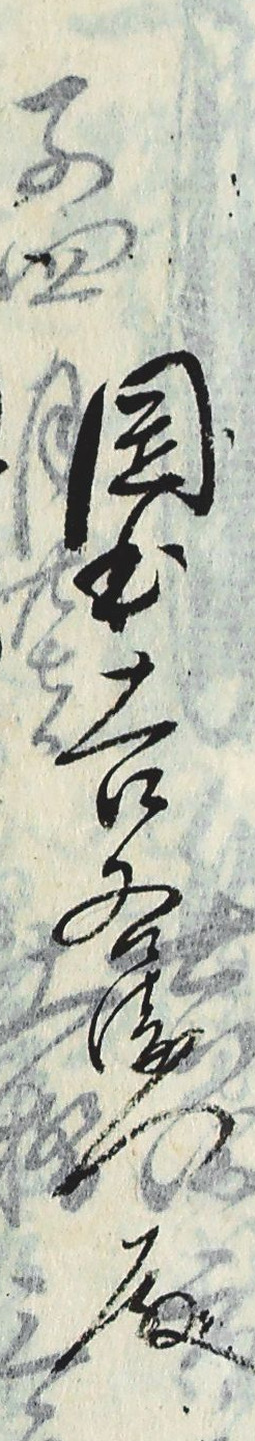岡本吉右衛門殿
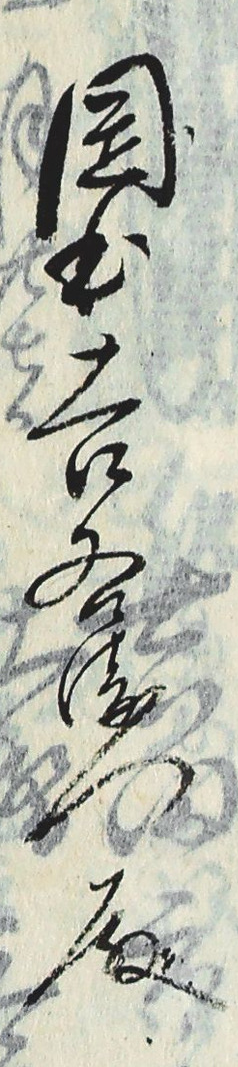岡本吉右衛門殿
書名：名東郡中諸割賦元帳
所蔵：鳴門教育大学 Naruto University of Education
